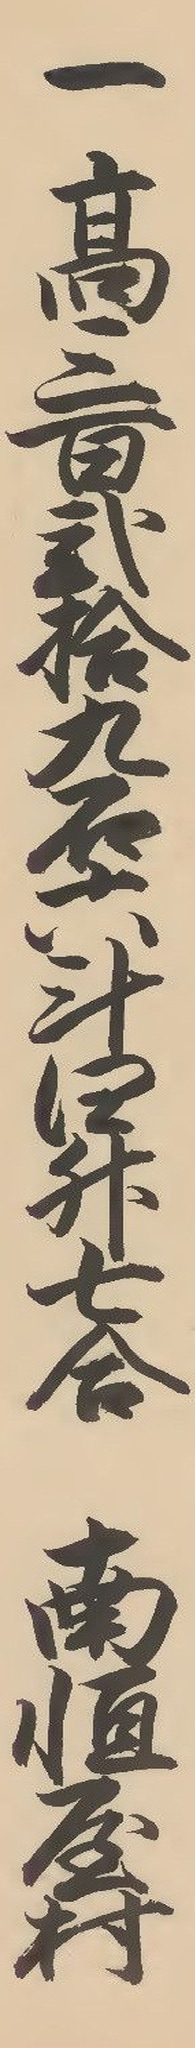一髙三百弐拾九石六斗四升七合南恒屋村

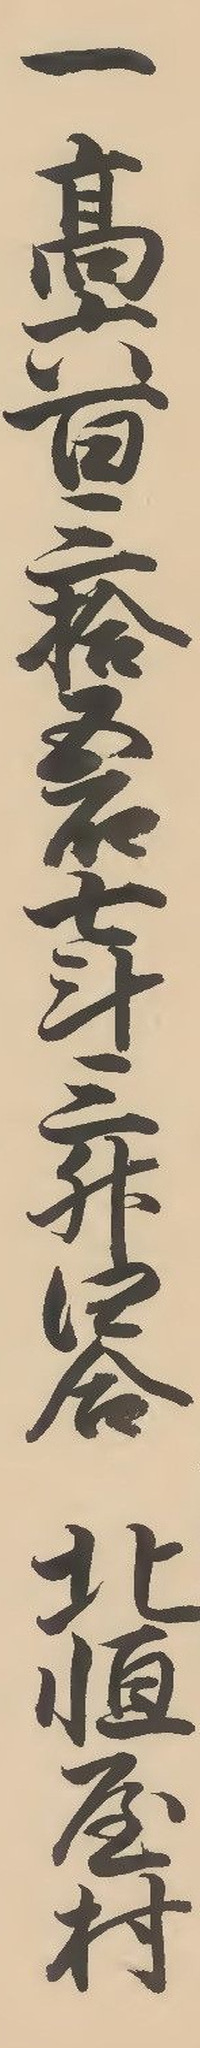一髙六百三拾五石七斗三升四合北恒屋村
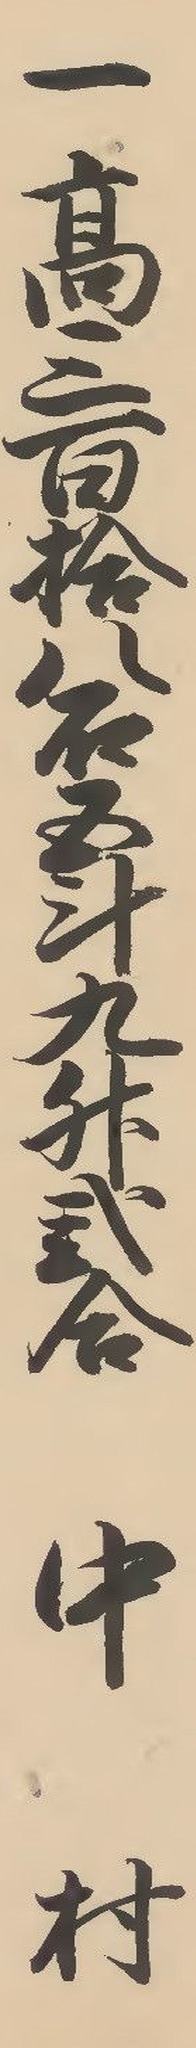一髙三百拾八石五斗九升弐合中村
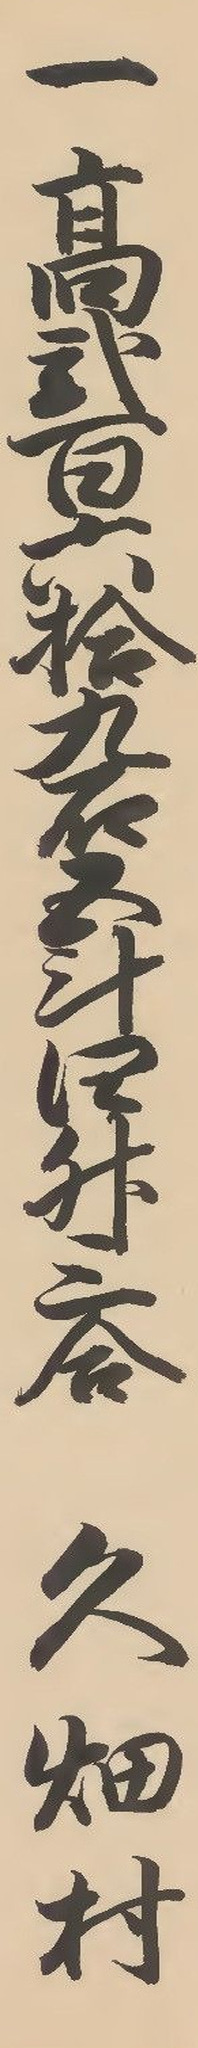一髙弐百六拾九石五斗四升三合久畑村
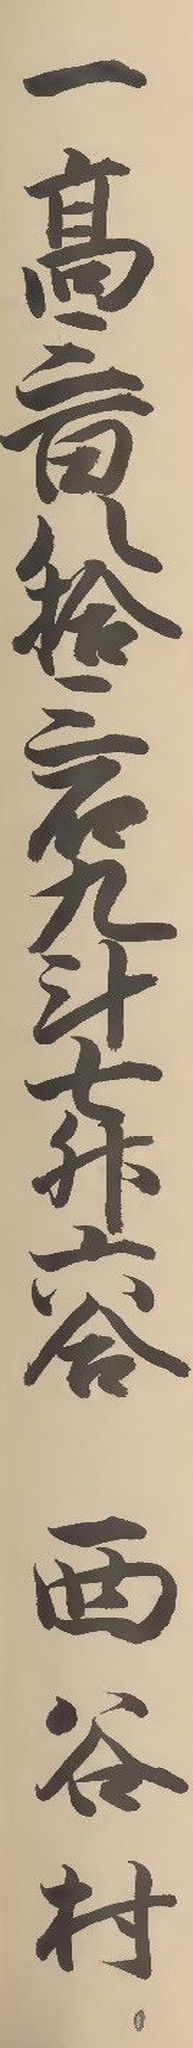一髙三百八拾三石九斗七升六合西谷村
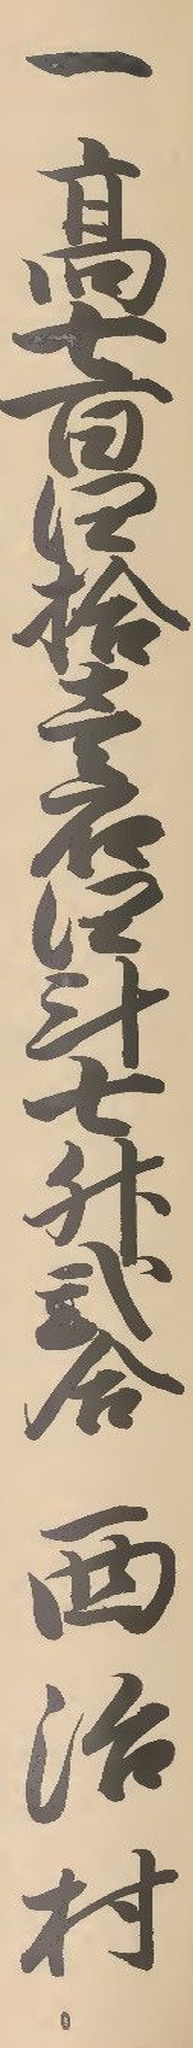一髙七百四拾壱石四斗七升弐合西治村
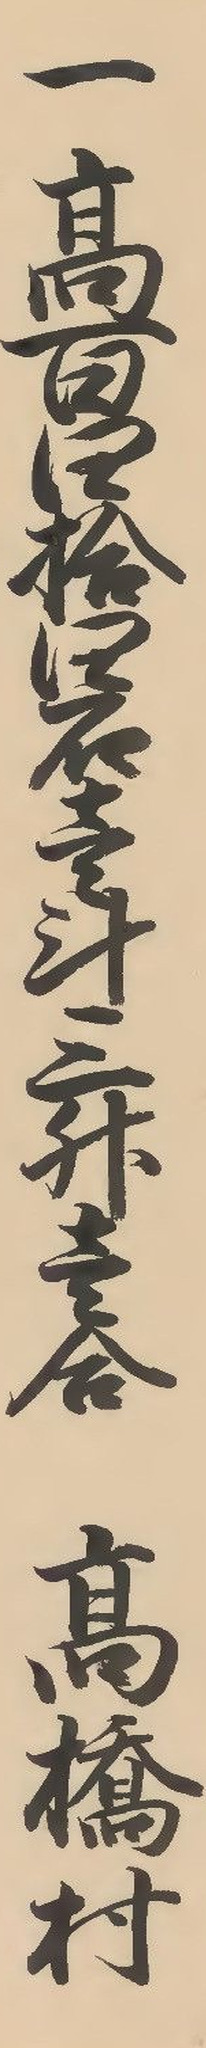一髙百四拾四石壱斗三升壱合髙橋村
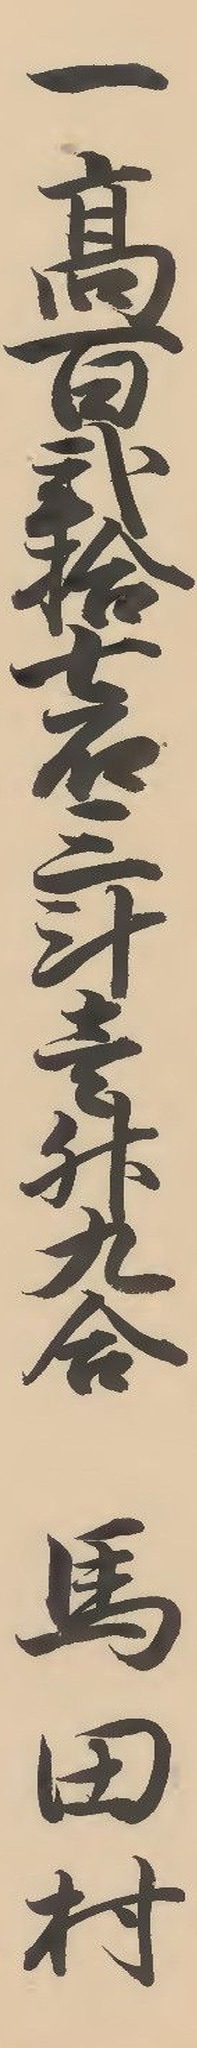一髙百弐拾七石三斗壱升九合馬田村
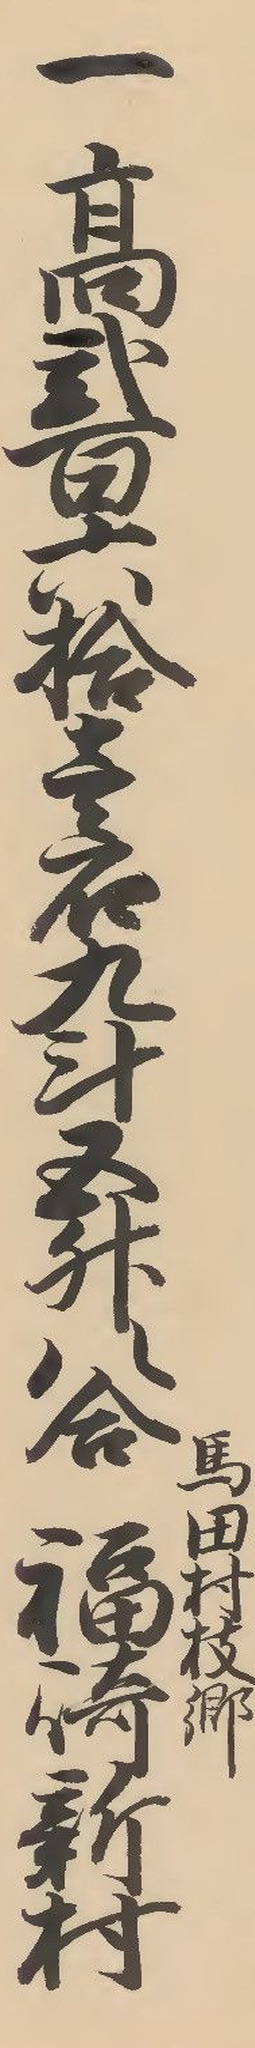一髙弐百六拾壱石九斗五升八合福崎新村

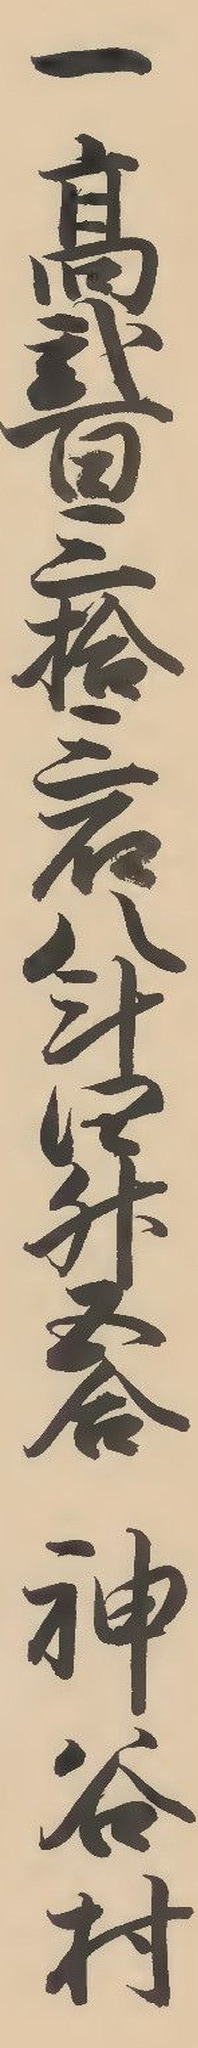一髙弐百三拾三石八斗四升五合神谷村
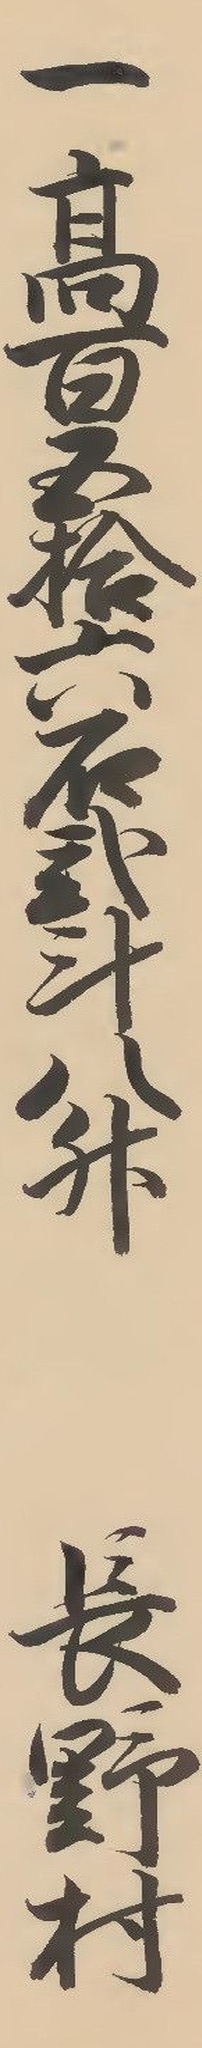一髙百五拾六石弐斗八升長野村
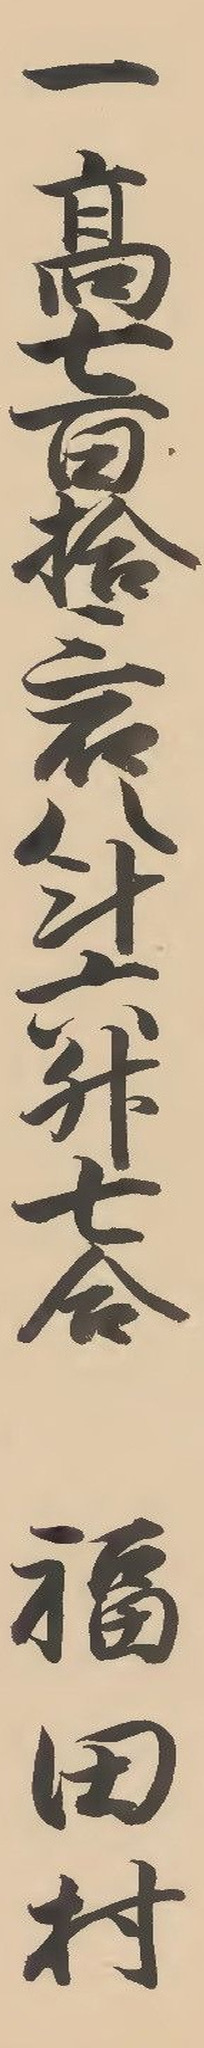一髙七百拾三石八斗六升七合福田村
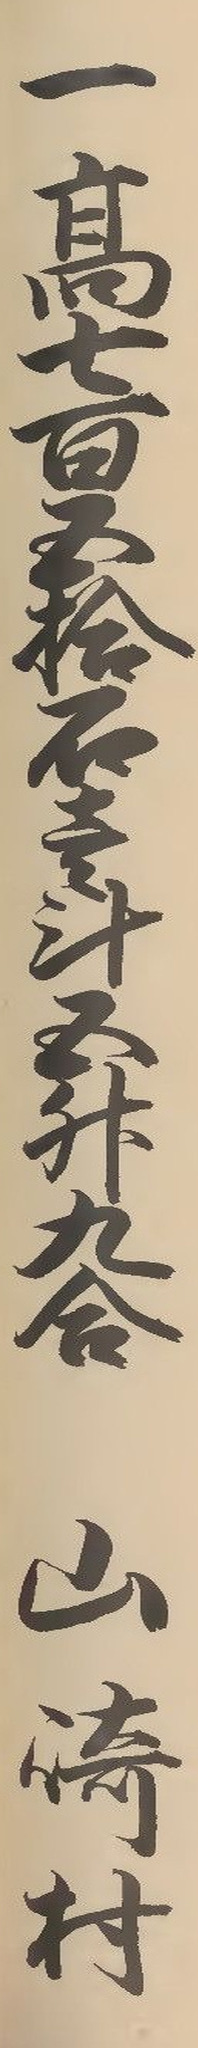一髙七百五拾石壱斗五升九合山崎村
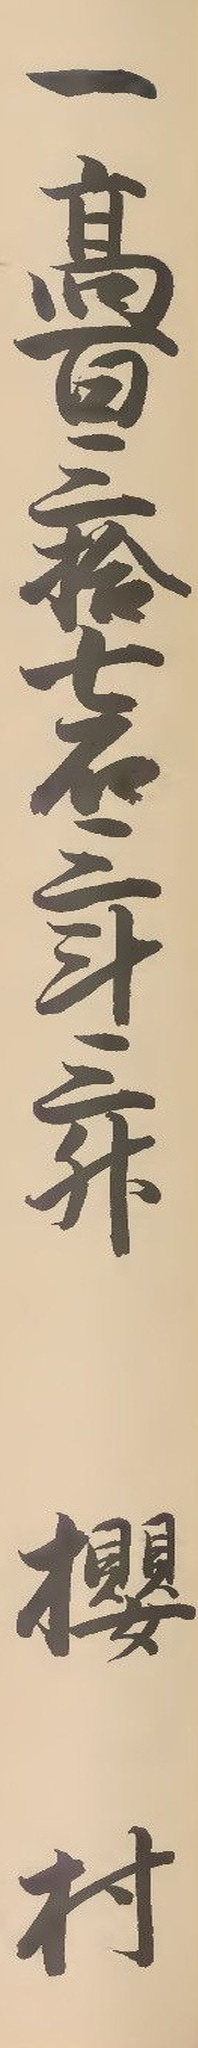一髙百三拾七石三斗三升櫻村
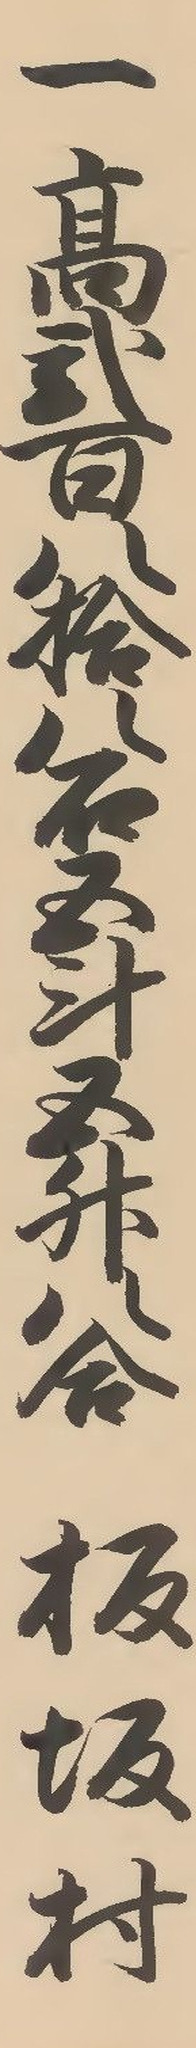一髙弐百八拾八石五斗五升八合板坂村
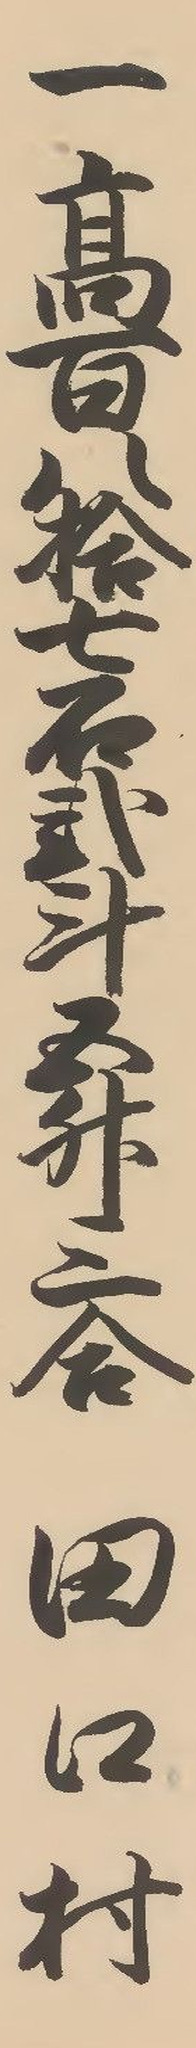一髙百八拾七石弐斗五升三合田口村
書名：播磨国郷帳
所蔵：国立公文書館 National Archives of Japan
